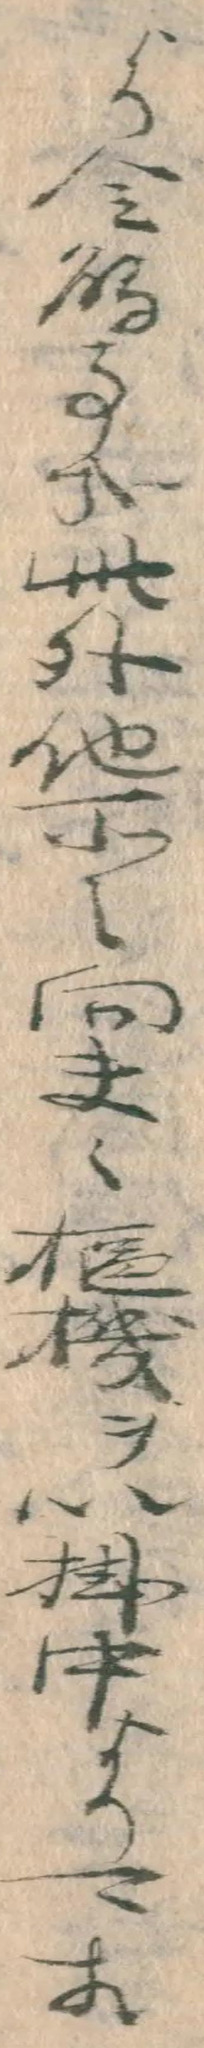より令触事哉此外他所之向夫々枢機ヲ以掛中より可相
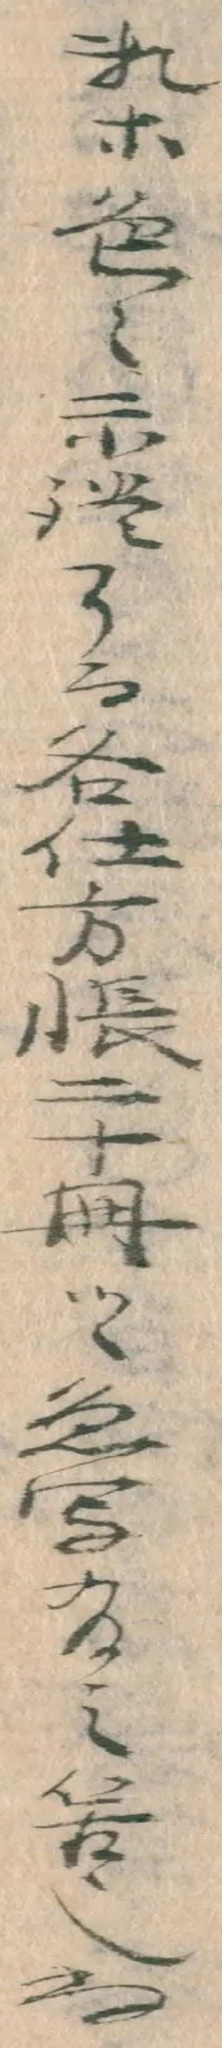頼等色々示談了而各仕方帳二十冊ツゝ急写有之筈也尚
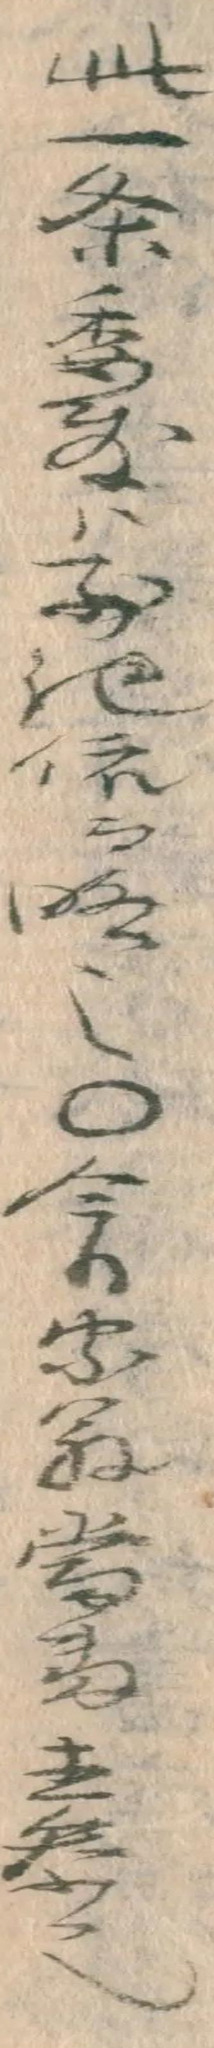此一条委敷ハ別記依而略之○今日家翁当番直参也
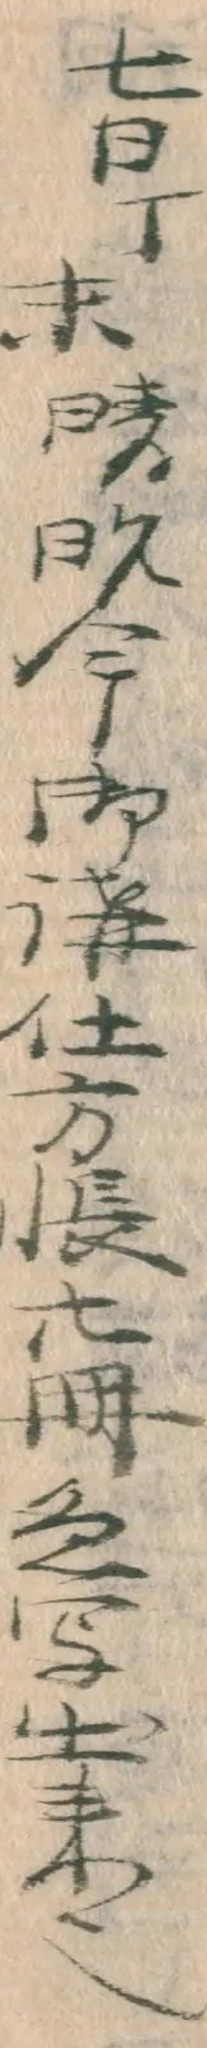七日丁未晴昨今御講仕方帳廿冊急写出来也
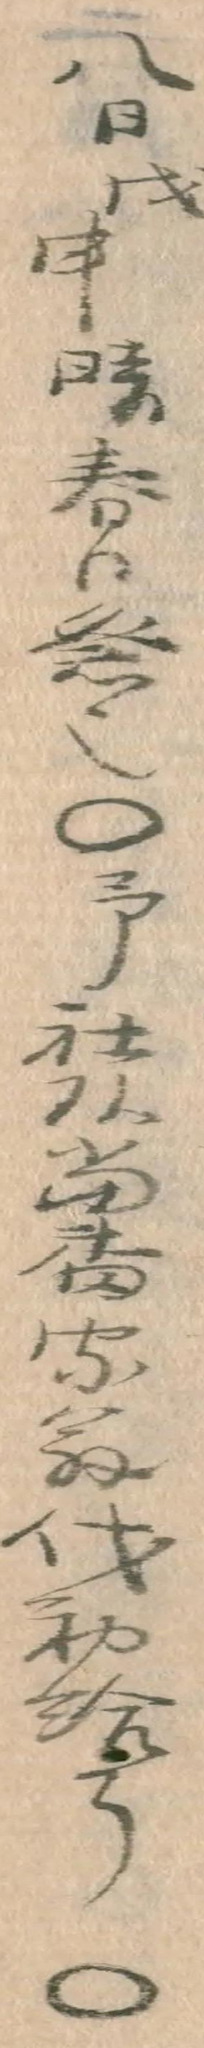八日戊申晴春日祭也○予社頭当番家翁代勤給了○
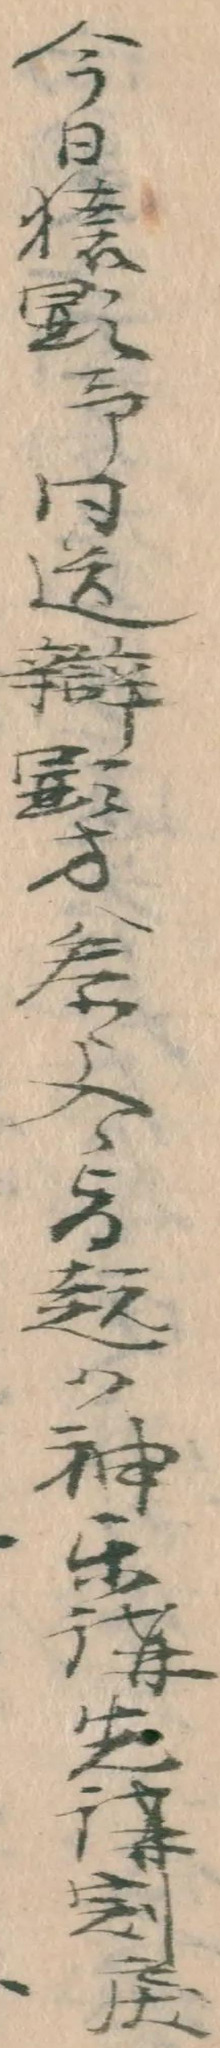今日猿顕予同道辯顕方へ参申入候旨趣ハ神樂講先講割戻
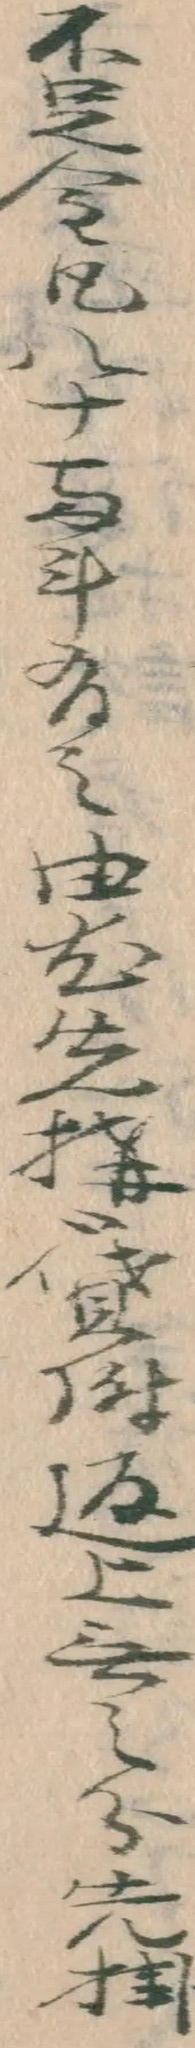不足金凡八十両計有之由尤先構御貸付返上無之分先掛
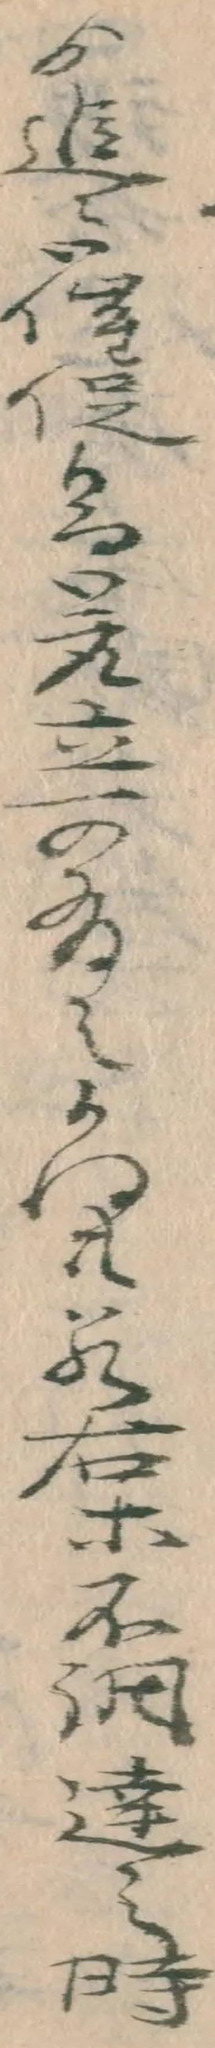ゟ追々御催促候而御取立可有之候得共若右等不調達之時
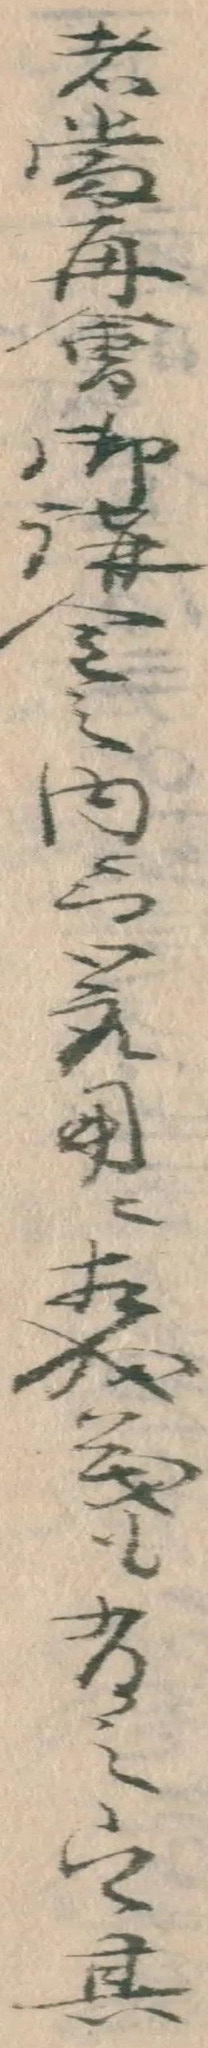者当再会御講金之内ニ而御取用ニ相成義も有之候ハゝ其
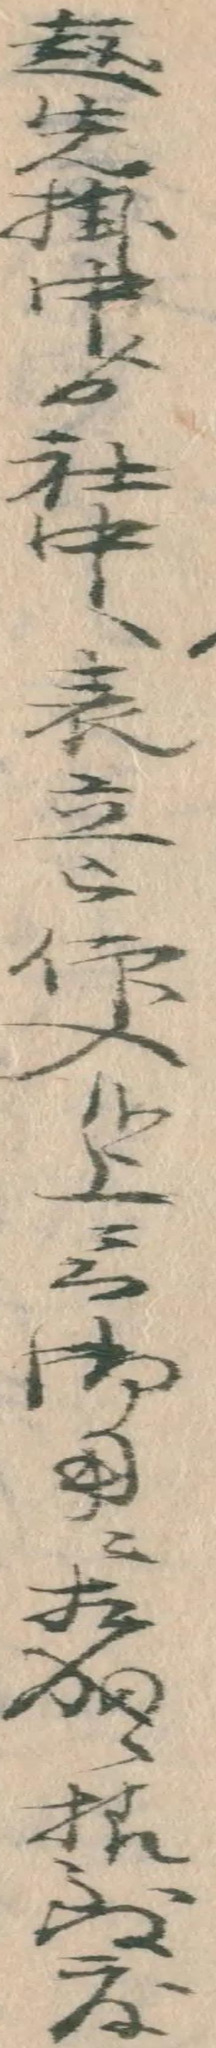趣先掛中ゟ社中へ表立被仰入候上ニ而御用ニ相成候様致度
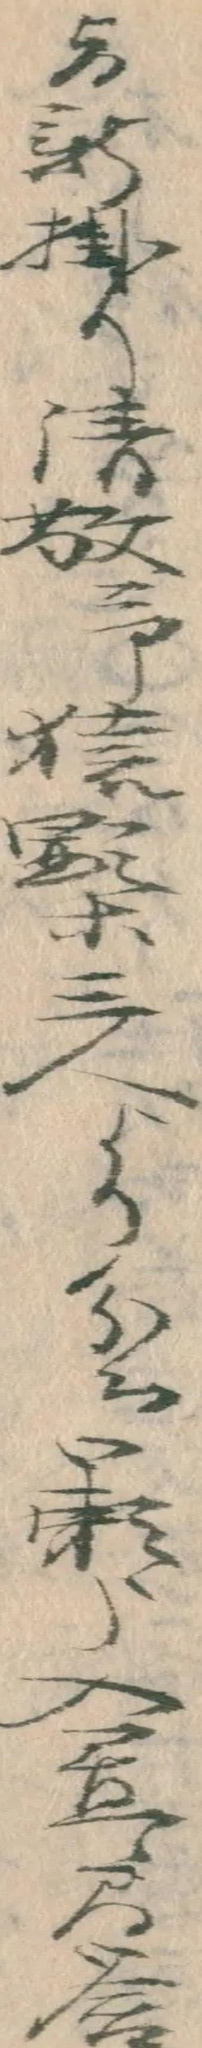旨新掛リ清敬予猿顕等三人より分而御頼申入置候間御含
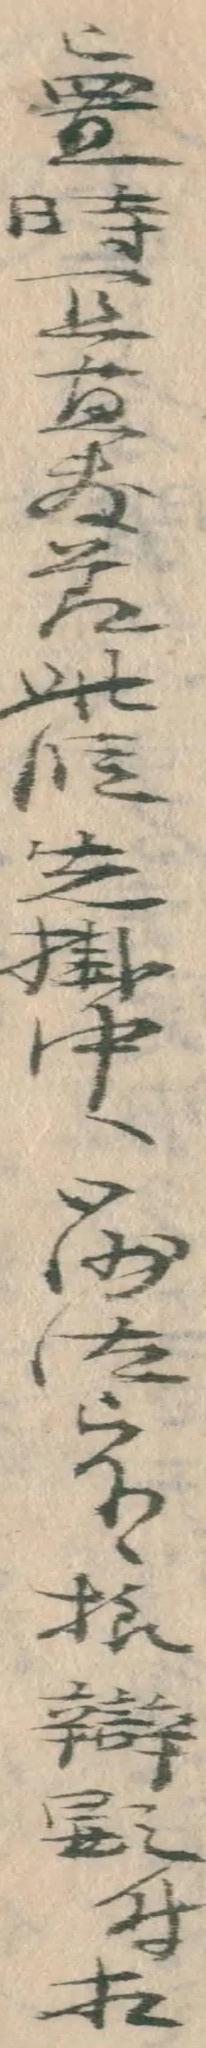被置時宜宜敷節此段先掛中へ御沙汰被下候様辯顕付相
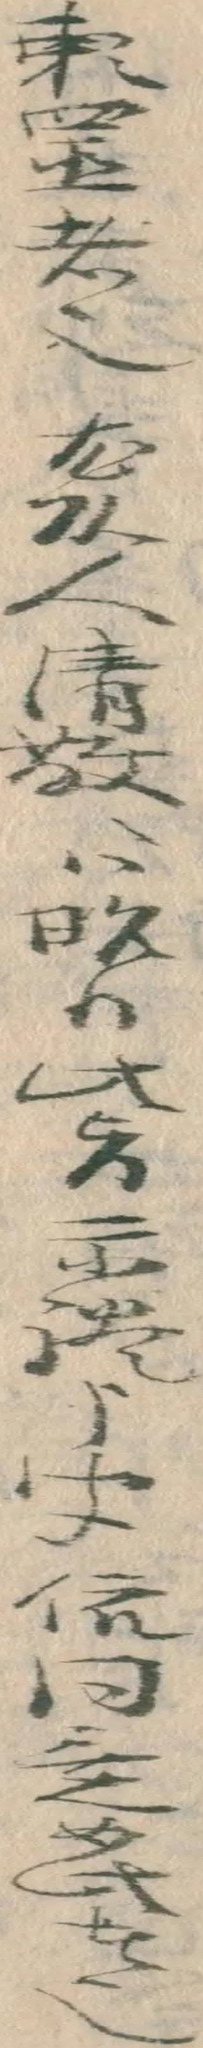頼置者也尤頭人清敬へハ昨日此旨示談申聞依同意如此者也
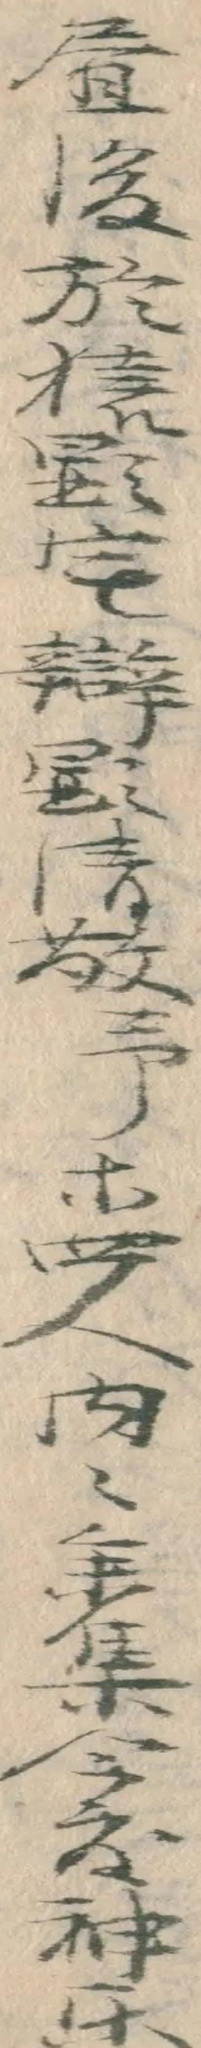昼後於猿顕宅辯顕清敬予等四人内々参集今度神樂
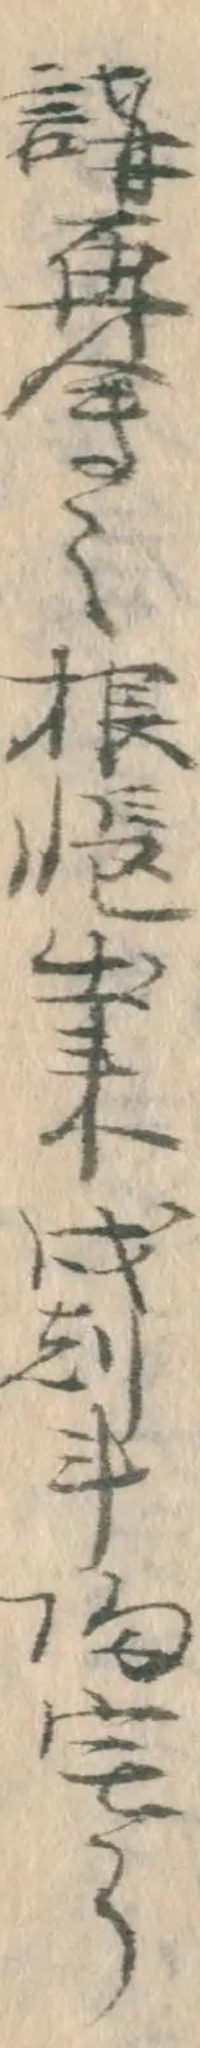講再会之根帳出来戌刻計帰宅了
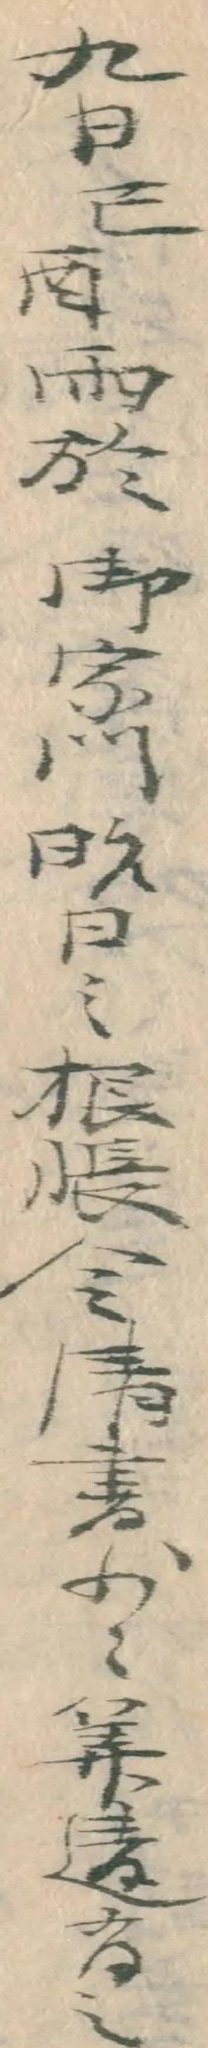九日己酉雨於御家門昨日之根帳令清書少々算違有之
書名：賀茂社記録. 第64冊
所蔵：国立国会図書館 National Diet Library, JAPAN
